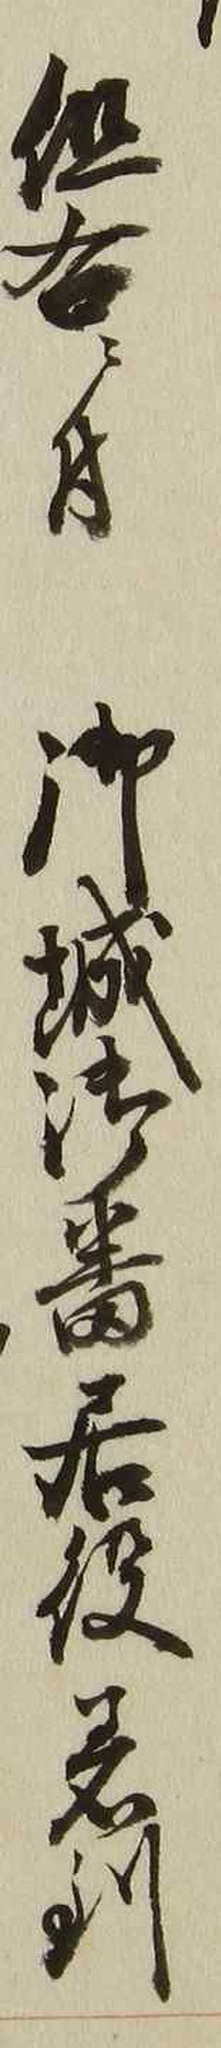但右ニ付御城御番居役着到
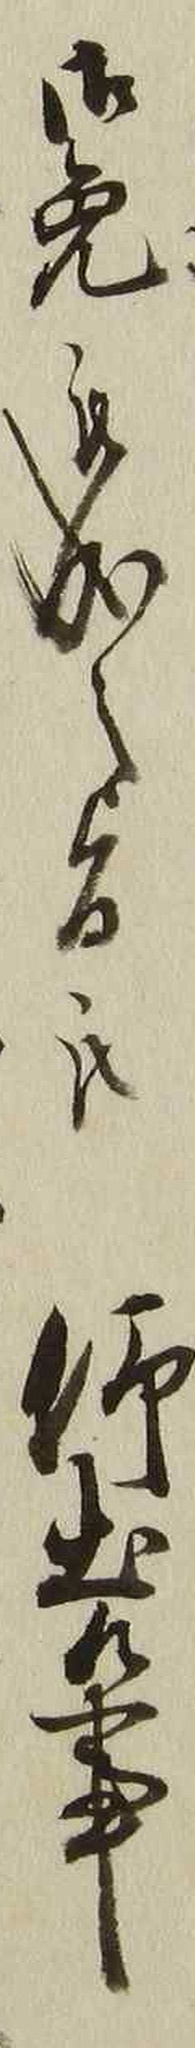御免被成之旨被仰出候事
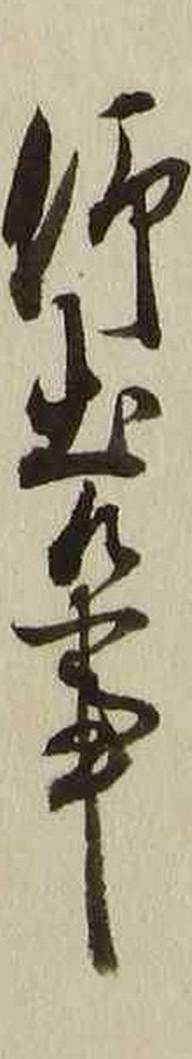仰付候事
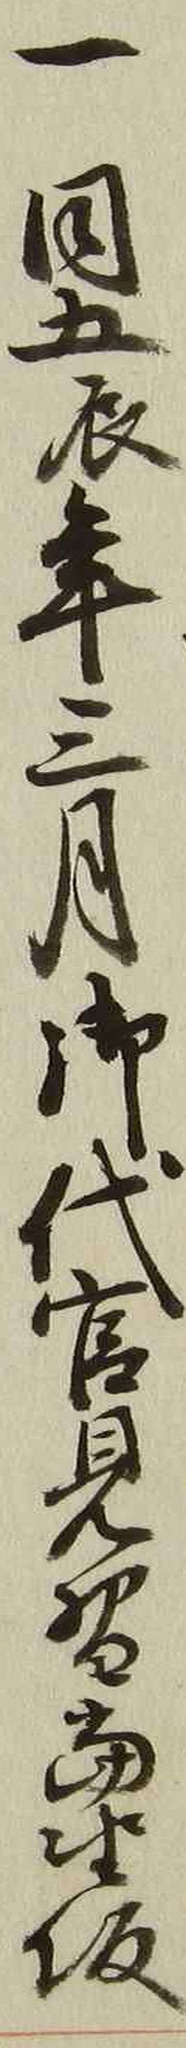一同五辰年三月御代官見習当座仮
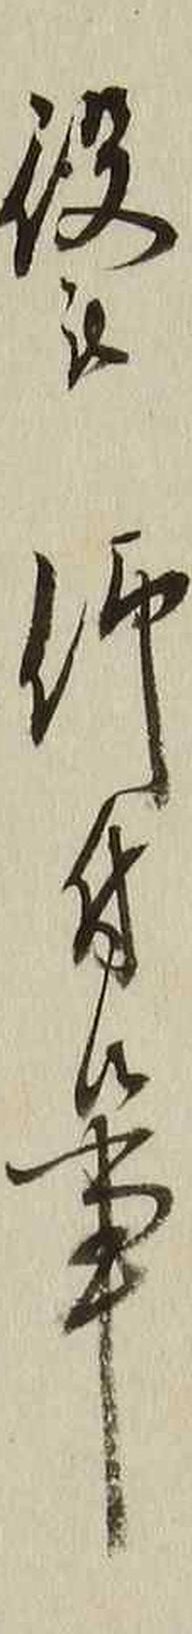役被仰付候事
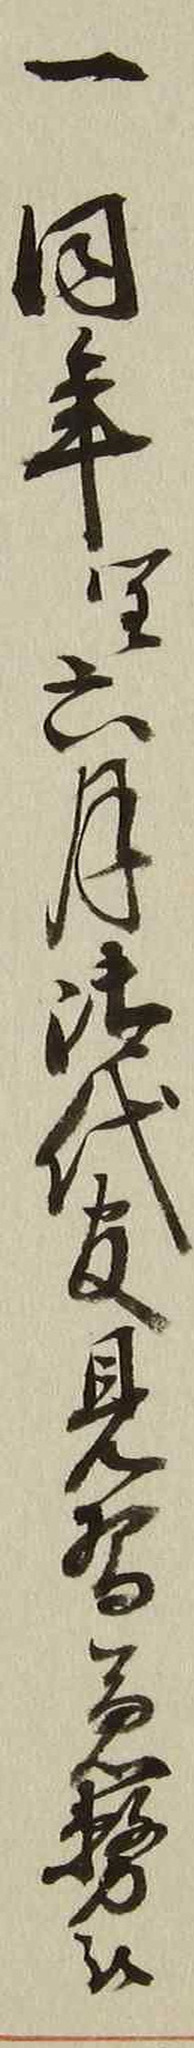一同年閏六月御代官見習兼務被
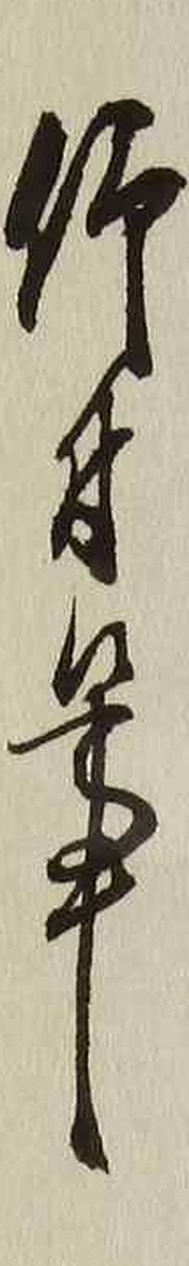仰付候事
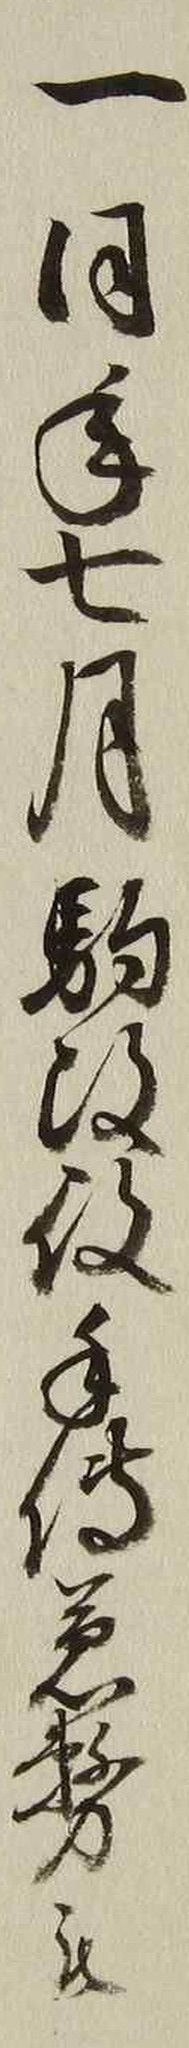一同年七月駒改役手伝兼務被
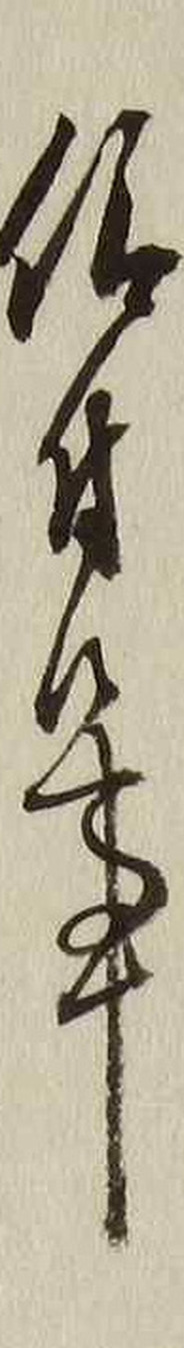仰付候事
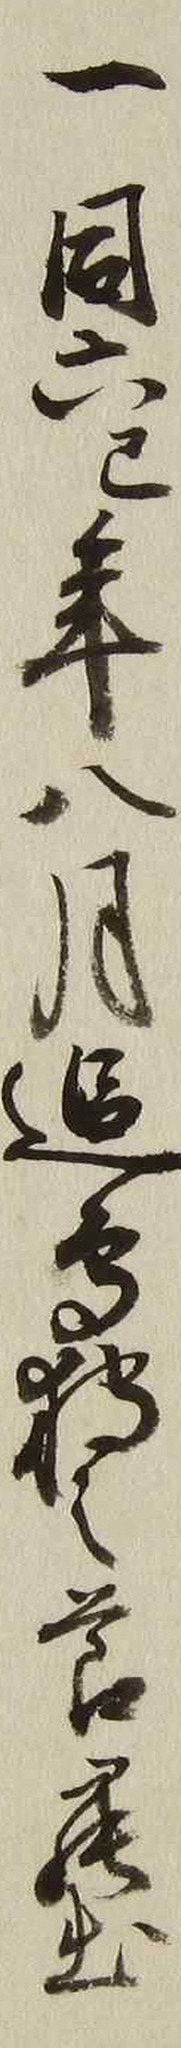一同六巳年八月追鳥狩之節罷出
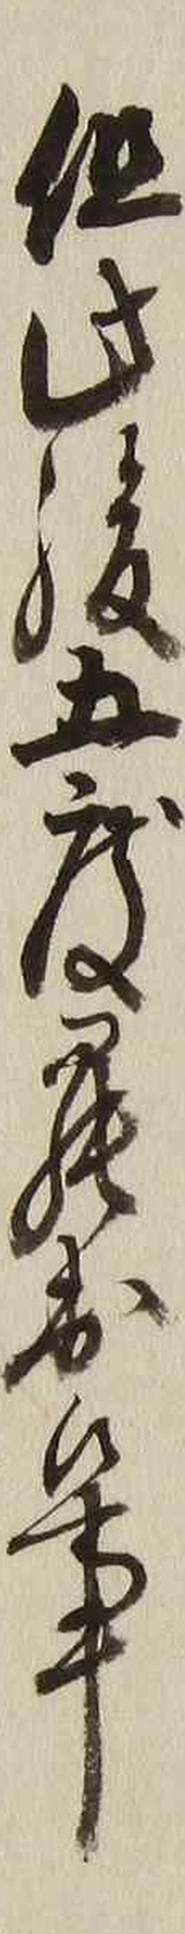但此後五度罷出候事
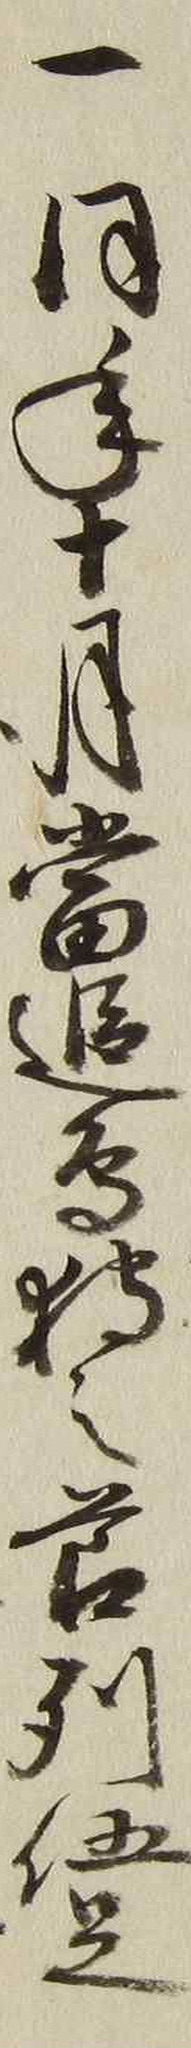一同年十月当追鳥狩之節列伍足
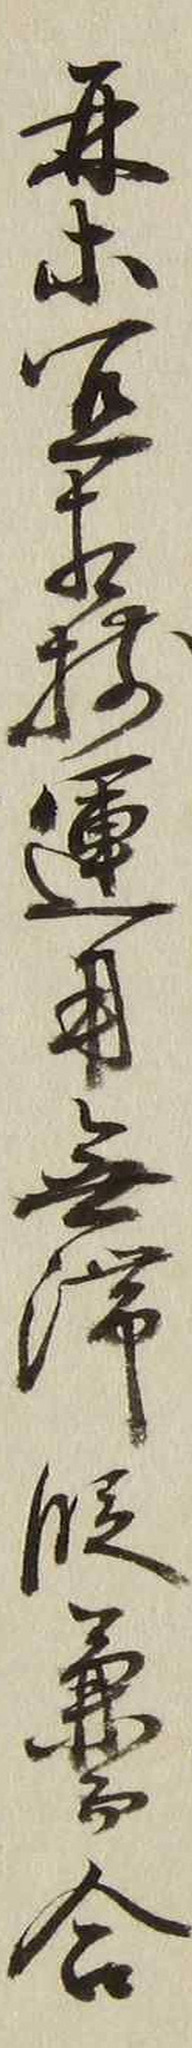并等宜相揃運用無滞段兼而合
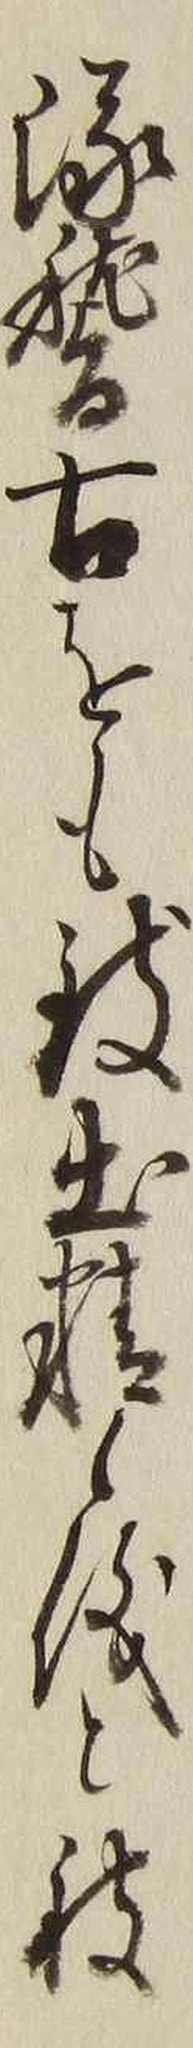隊稽古をも致出精候儀と被
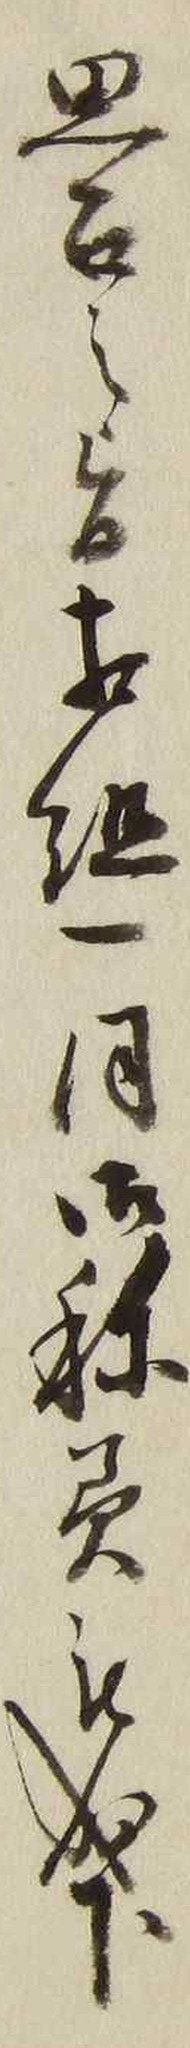思召之旨相組一同御称美被成下

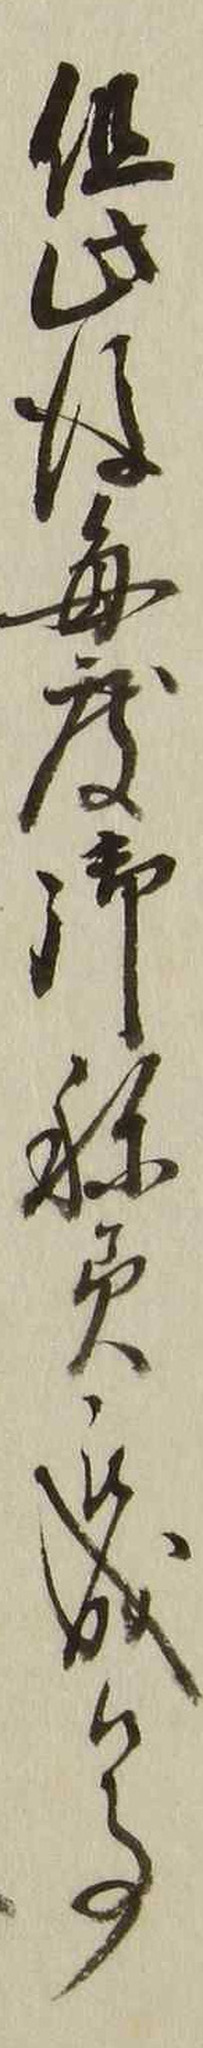但此後毎度御称美被成候事
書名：諸士系譜　巻之27　い之部27
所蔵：会津若松市立会津図書館
